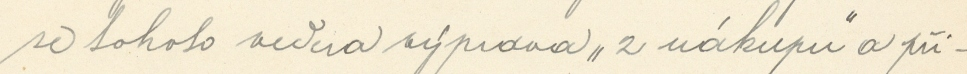se tohoto večera výprava „z nákupu“ a při-
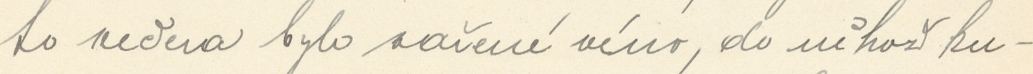to večera bylo vařené víno, do něhož ku-
